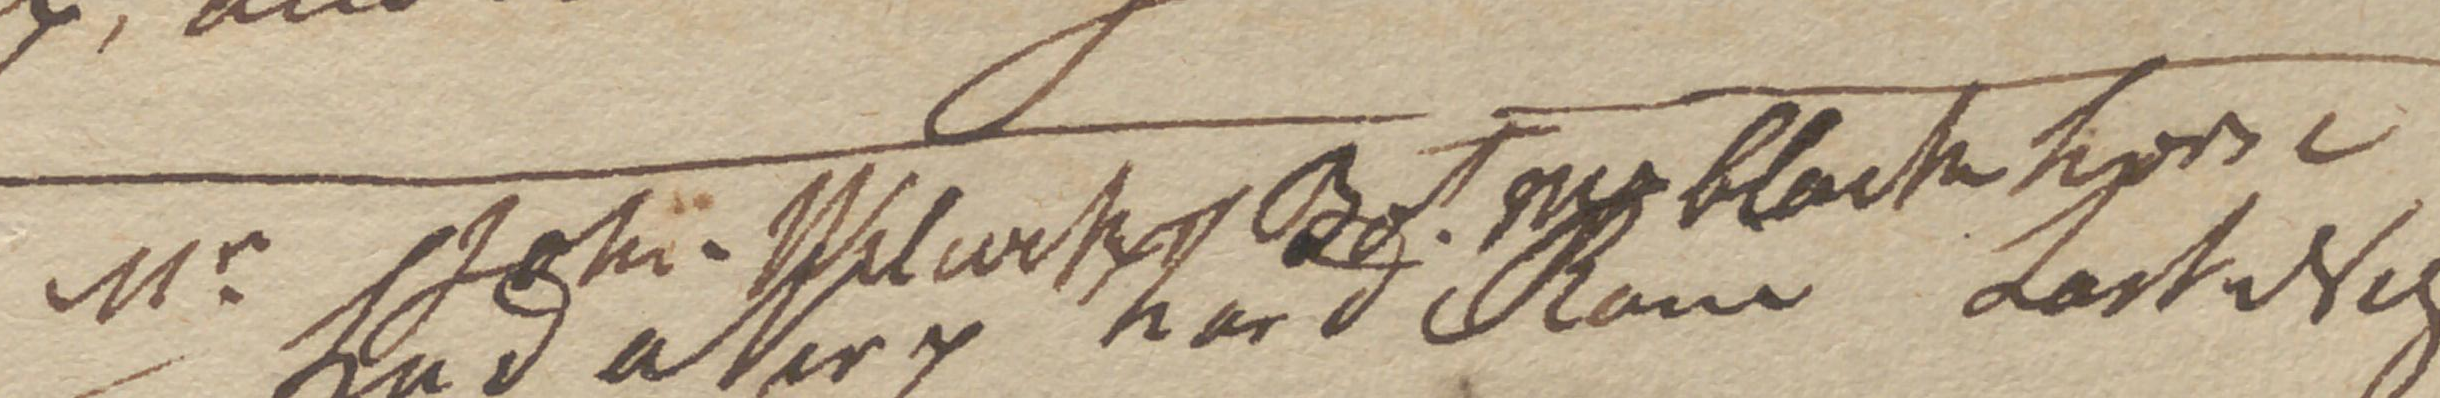M^r. John Wilcock Bo^t. my black horse
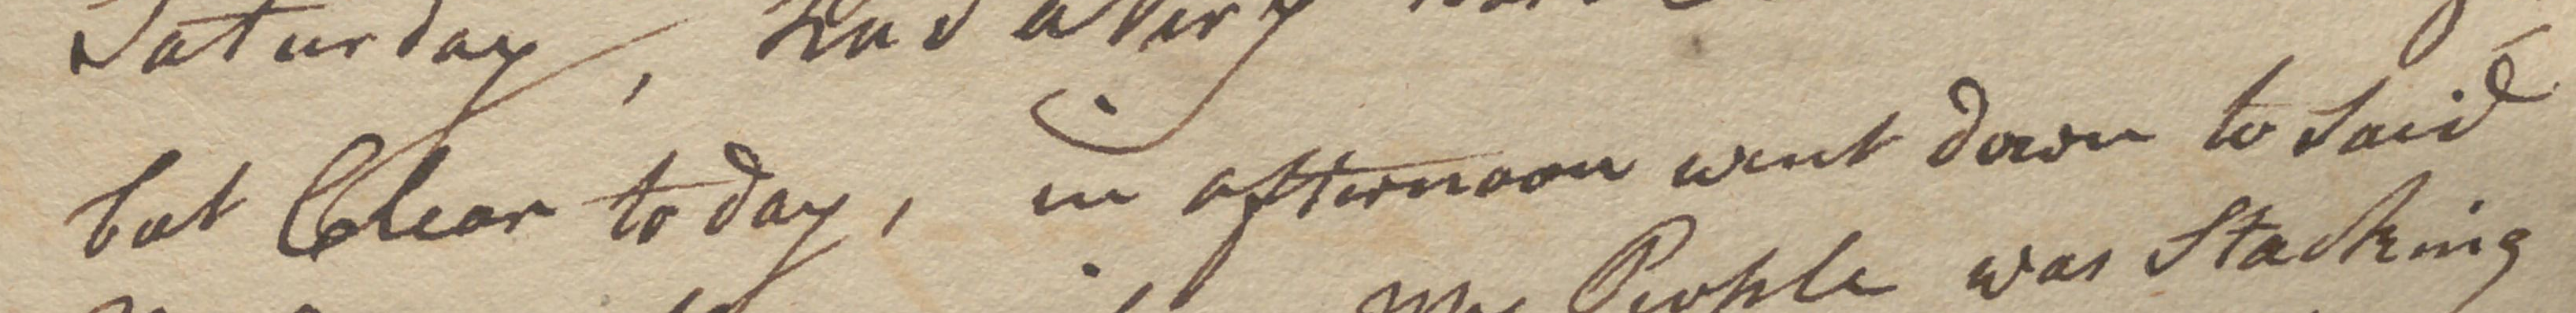but Clear to day, in afternoon went down to said
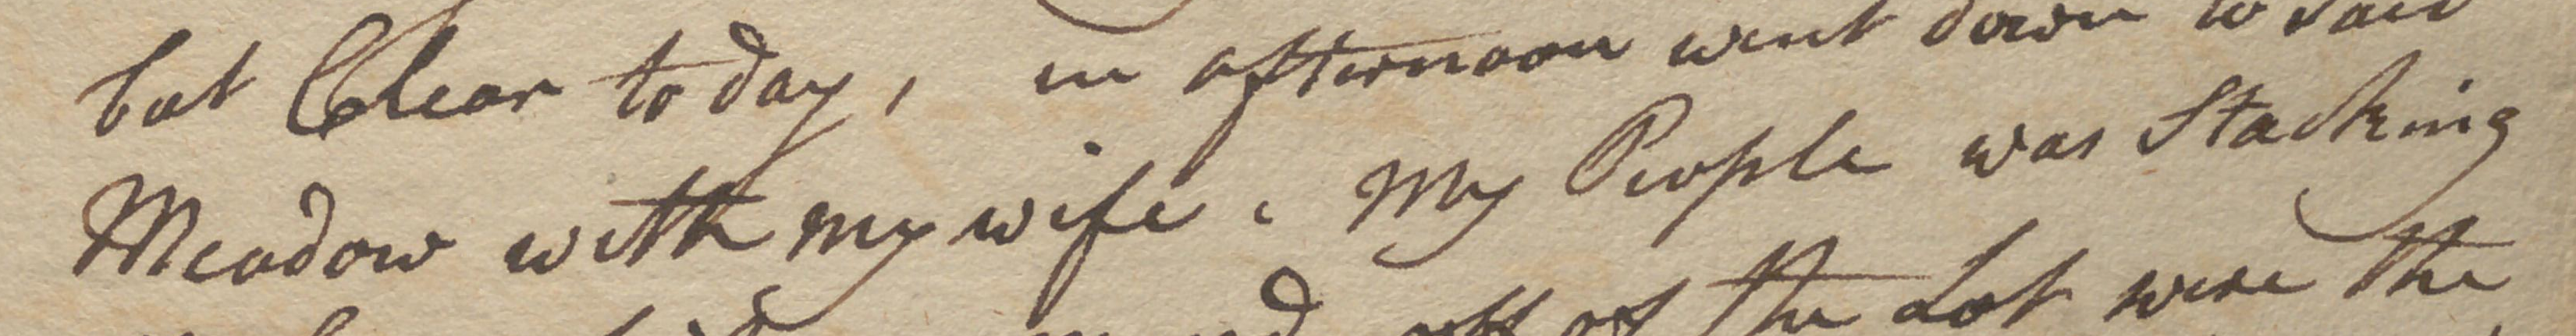Meadow with my wife. My People was Stacking
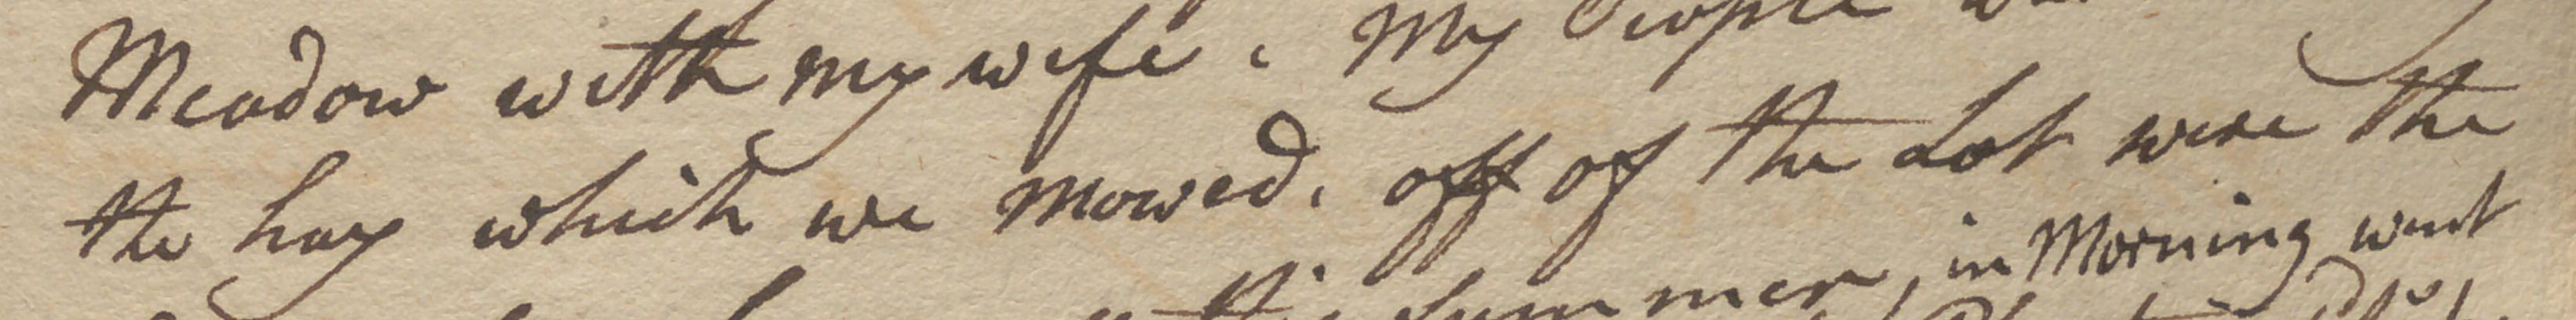the hay which we mowed. off of the Lot were the
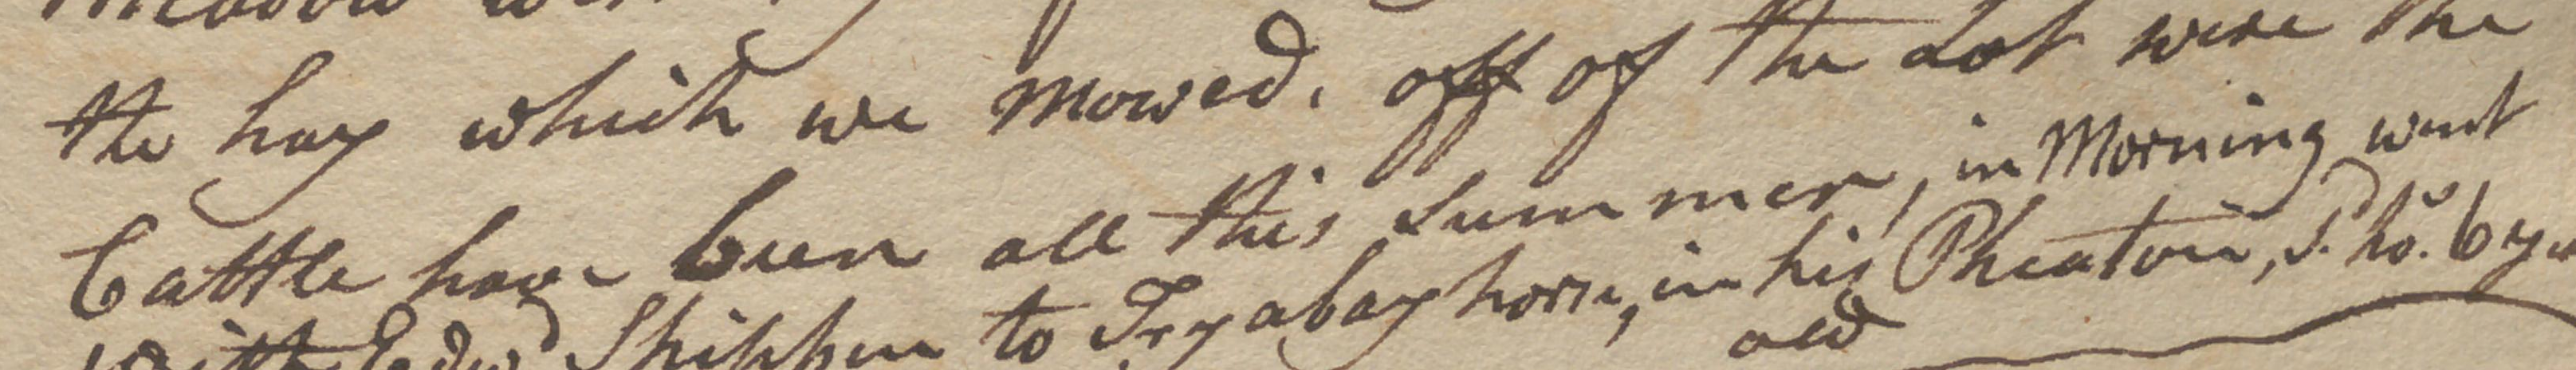Cattle have been all this Summer, in Morning went
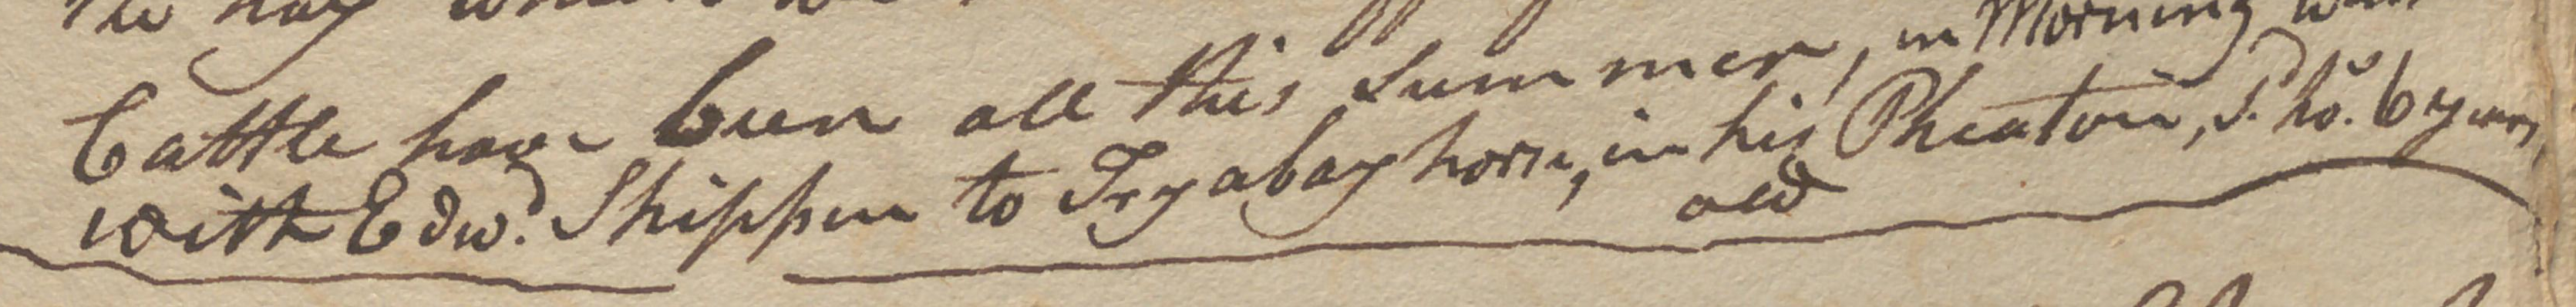with Edw^d. Shippen to Try a bay horse, in his Pheaton, s^d. ho^s. 2 years
